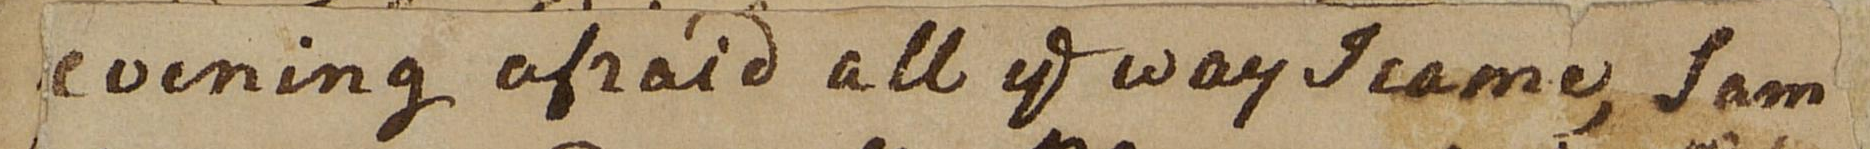evening afraid all y^e way I came, Sam
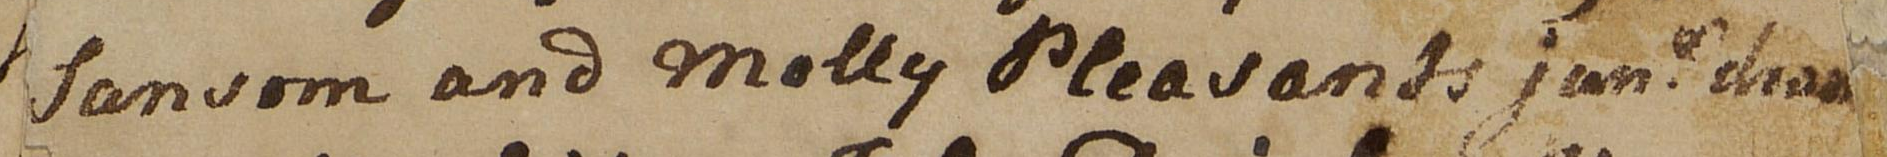Sansom and Molly Pleasants jun^r. drank
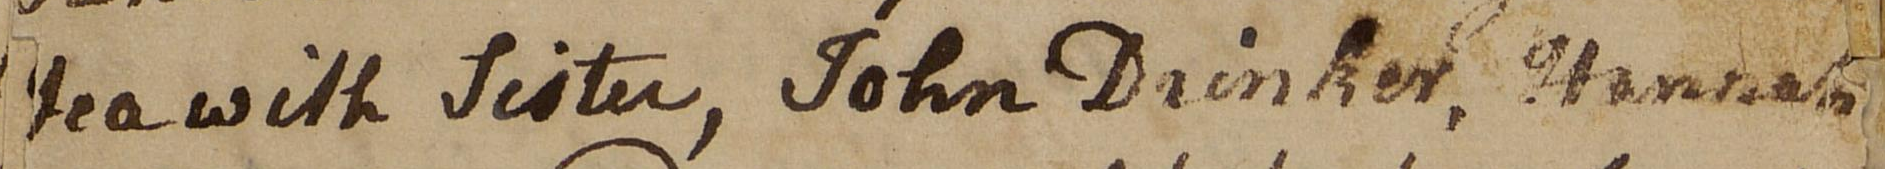tea with Sister, John Drinker, Hannah
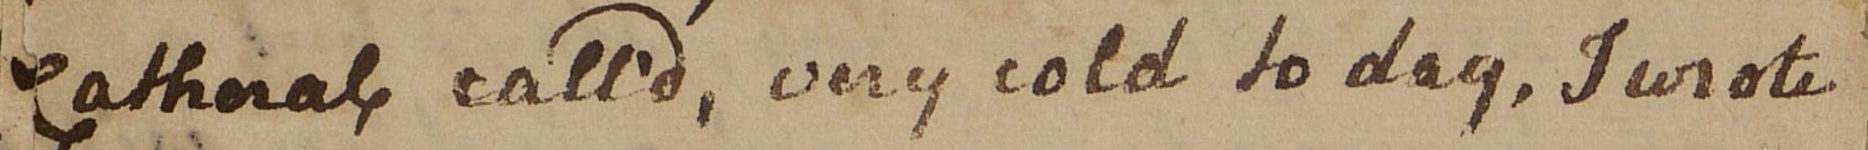Catheral call'd, very cold to day, I wrote
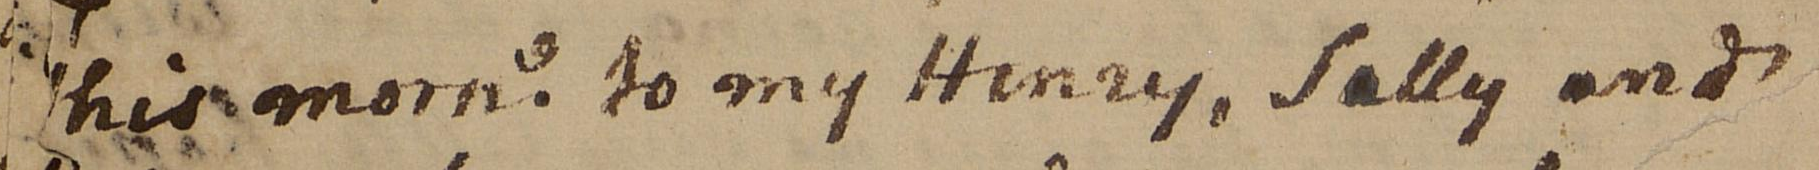[t]his morn^g. to my Henry, Sally and
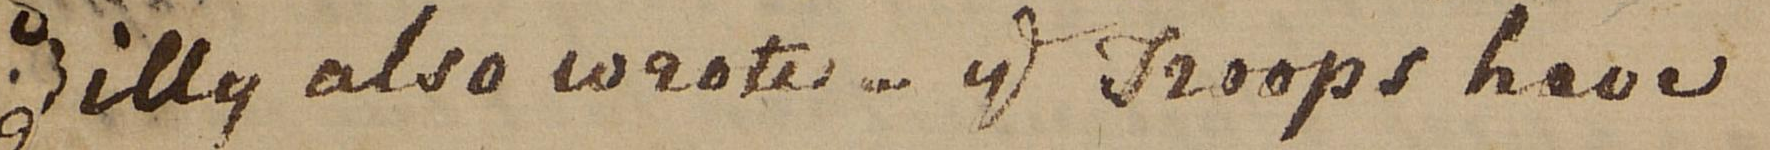Billy also wrote- y^e Troops have
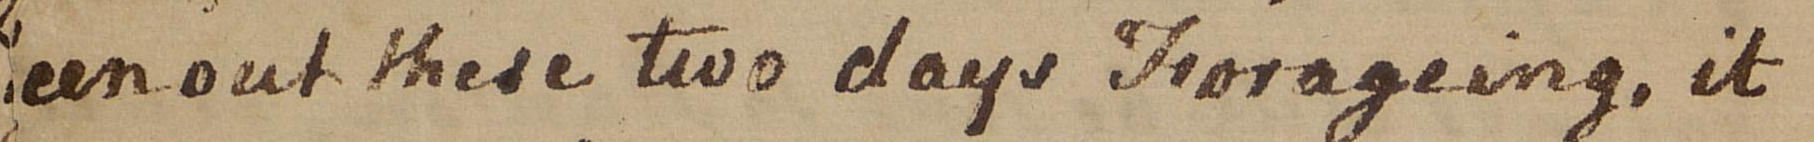een out these two days Forageing, it
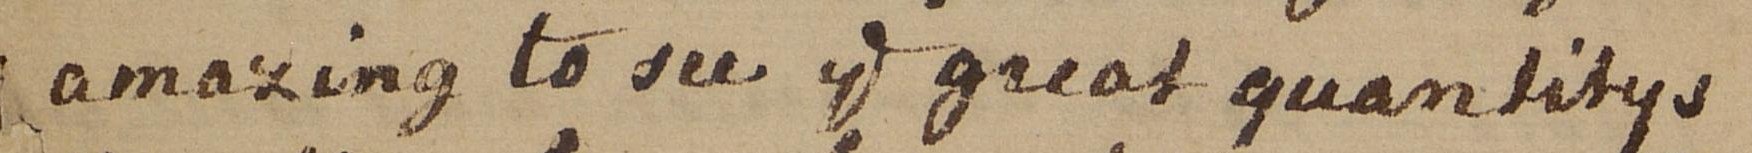amazing to see y^e great quantitys
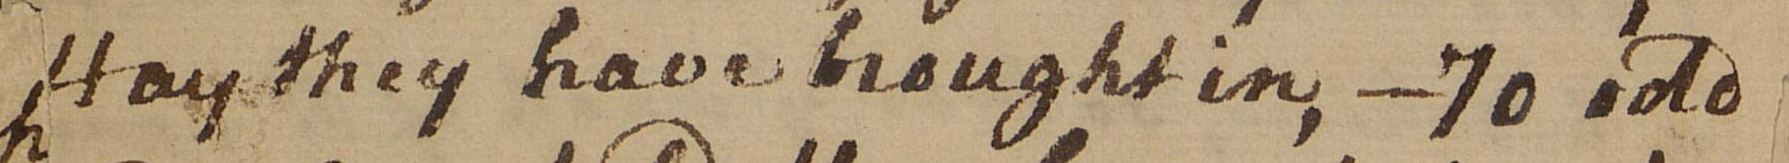Hay they have brought in,- 70 odd
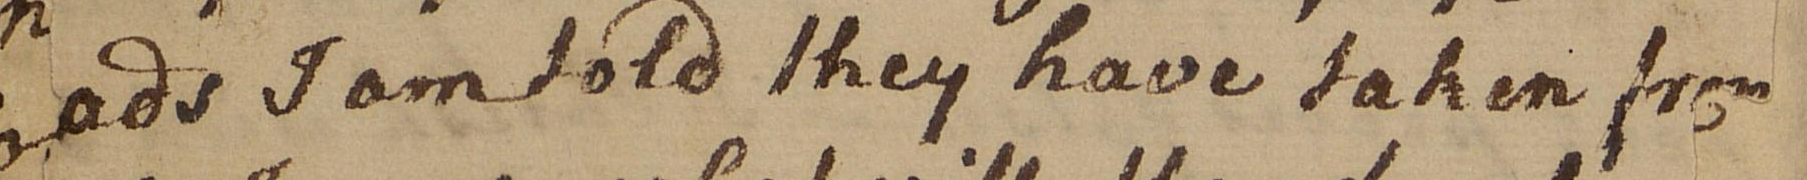ads I am told they have taken from
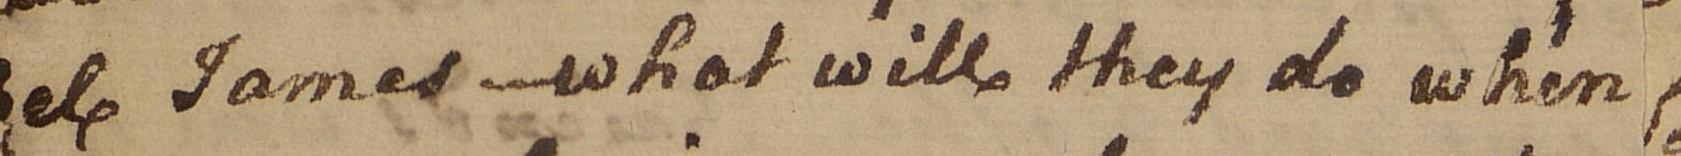el James- what will they do when
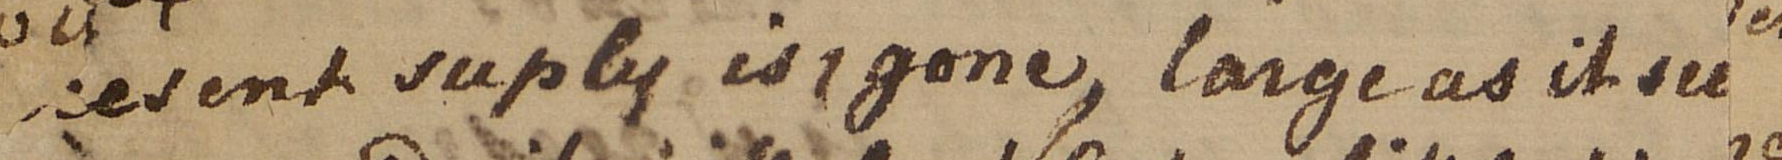resent suply is gone, large as it see
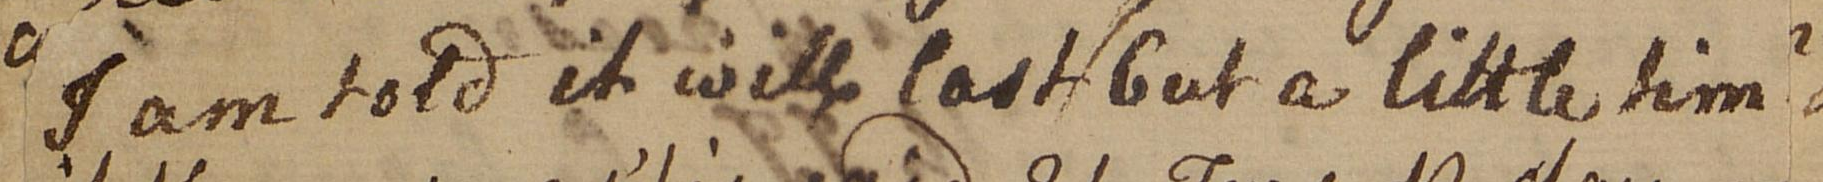I am told it will last but a little tim
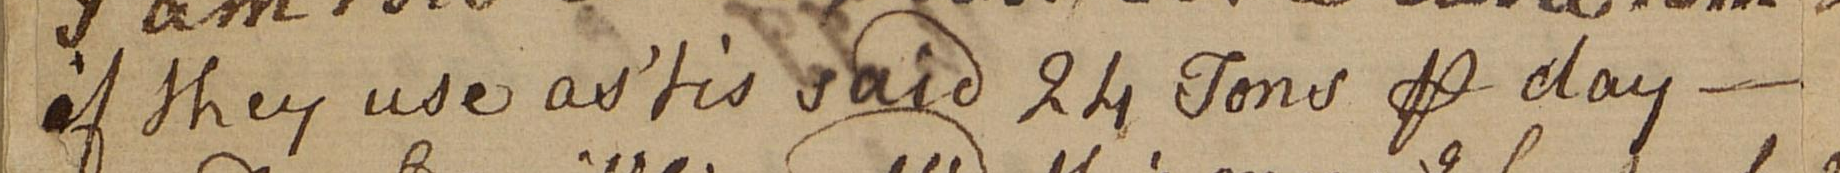of they use as 'tis said 24 Tons per day-
